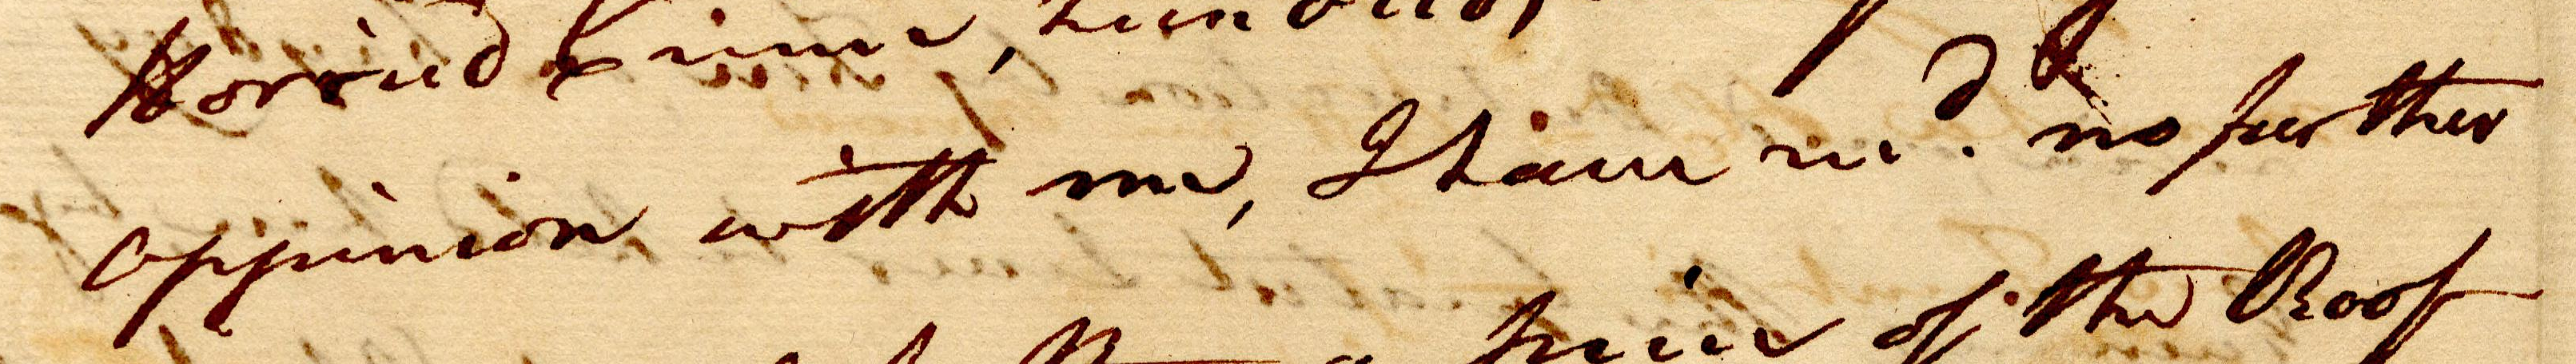oppinion, with me, I have rec^d. no further
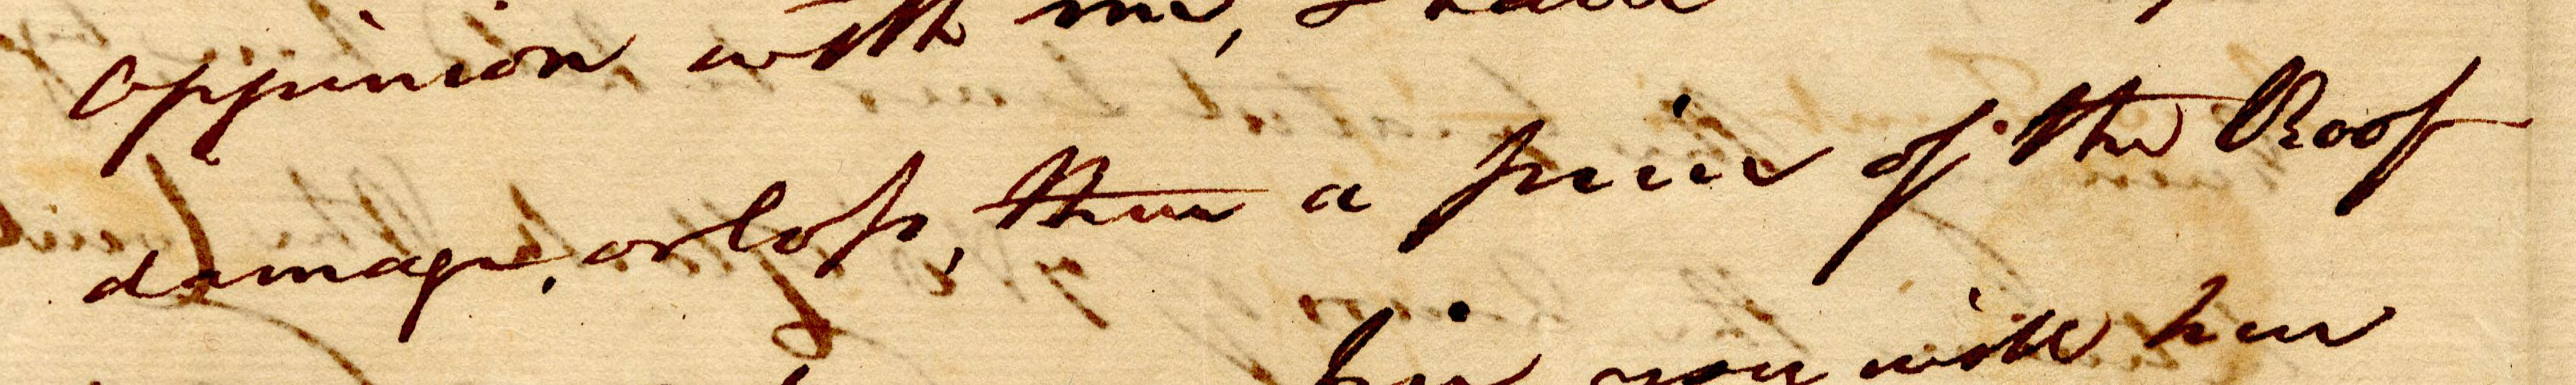damage or loss, then a piece of the Roof
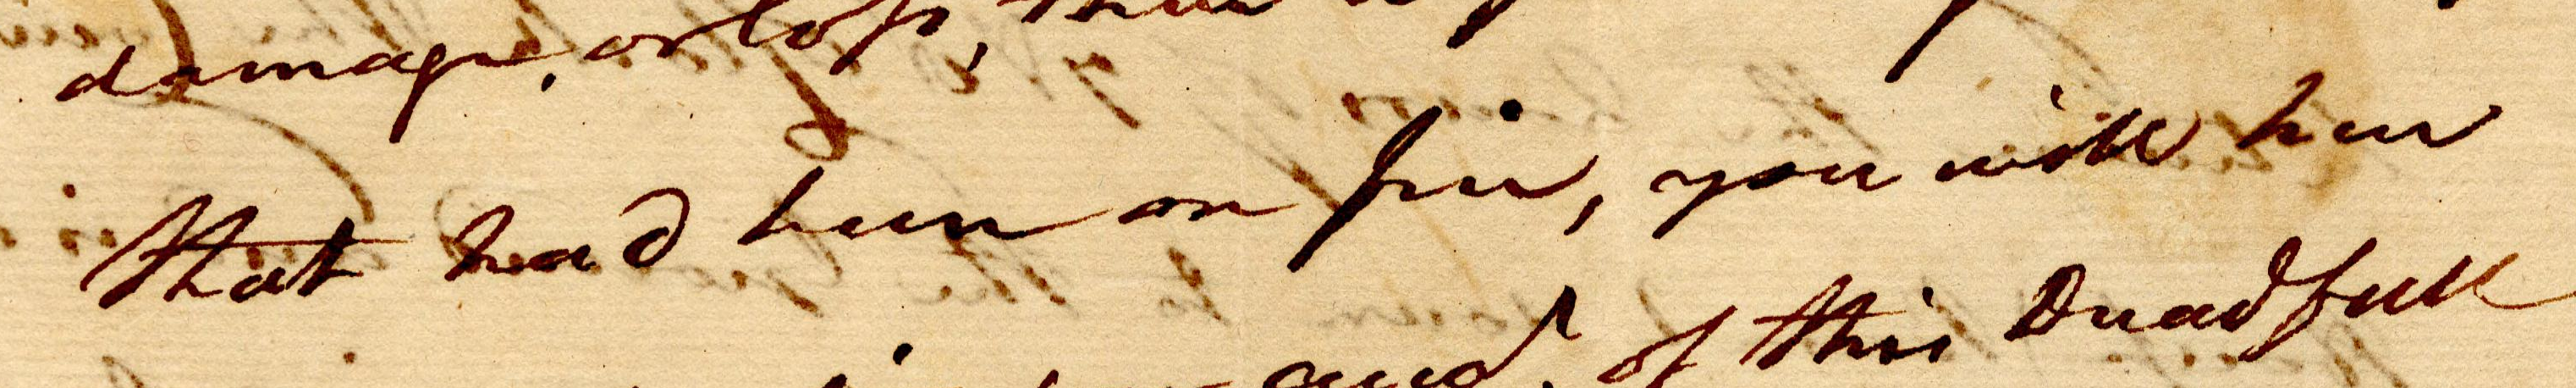that had been on fire, you will here
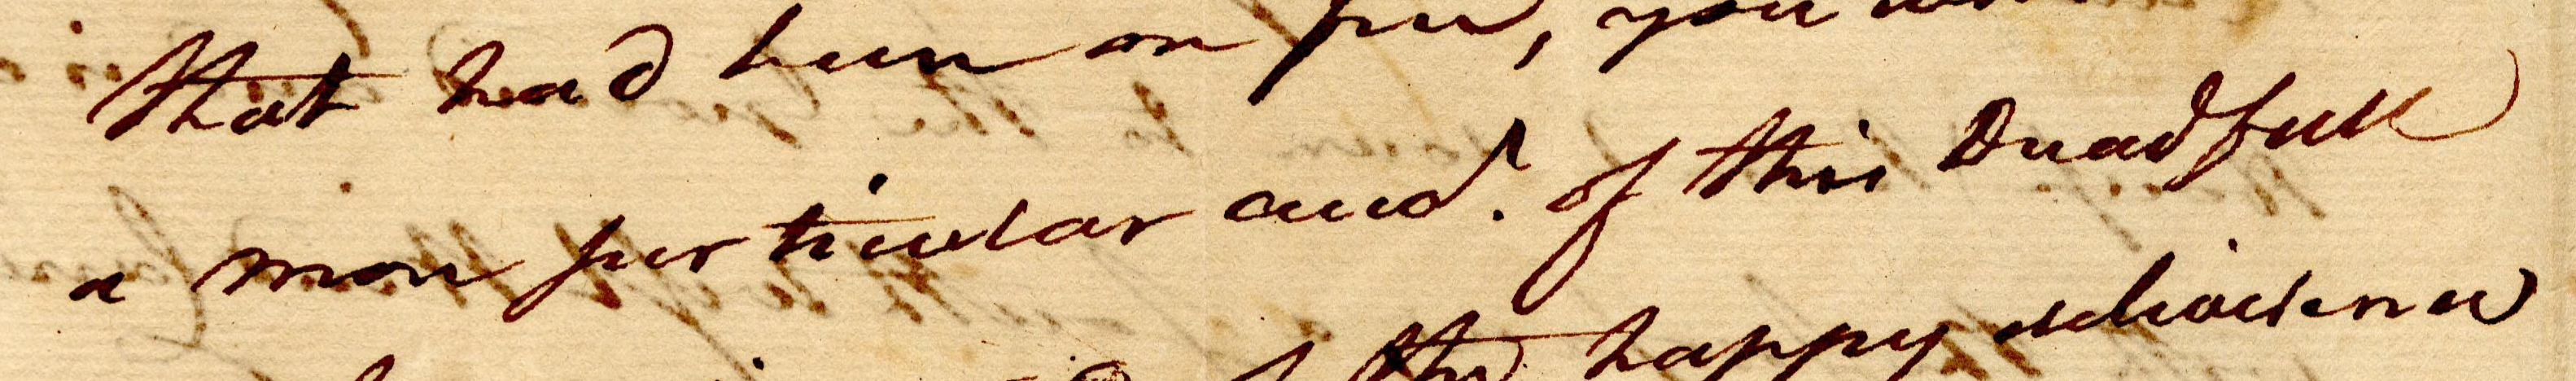a more particular acco^t. of this Dreadfull
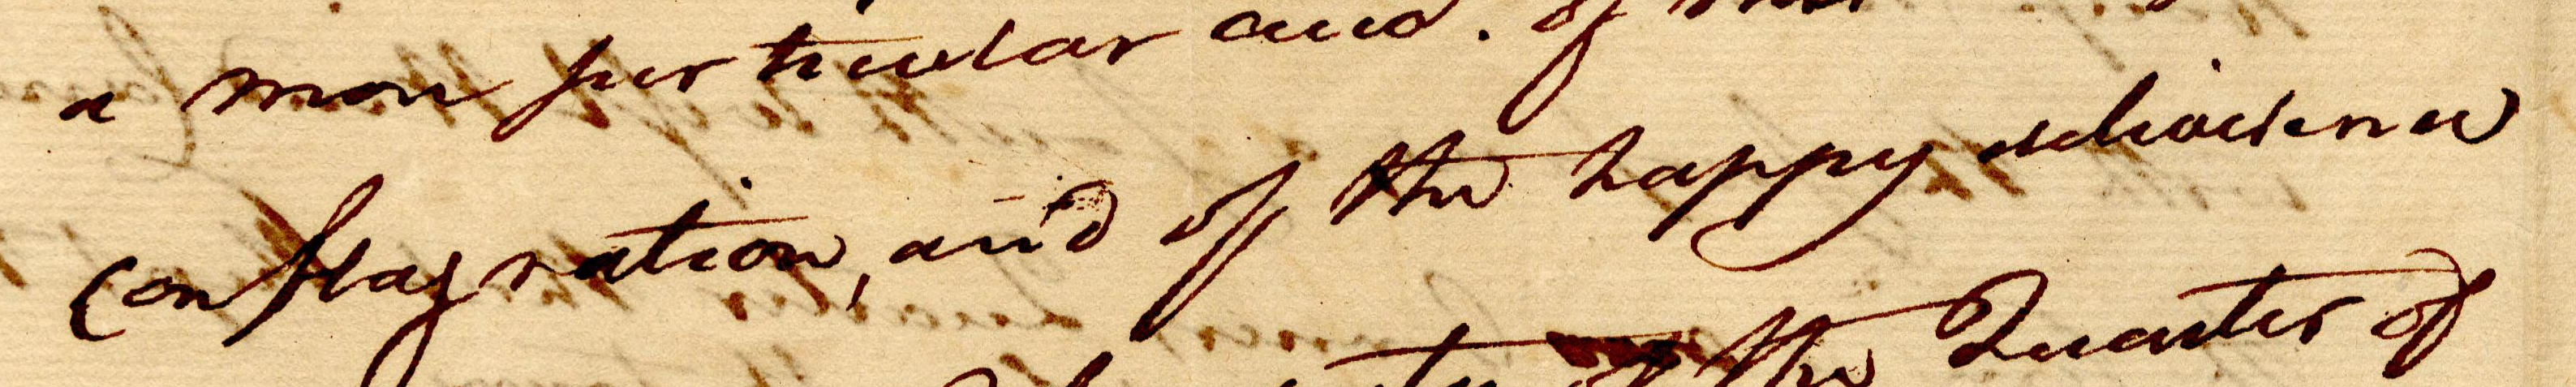conflagration, and of the happy acliactence
